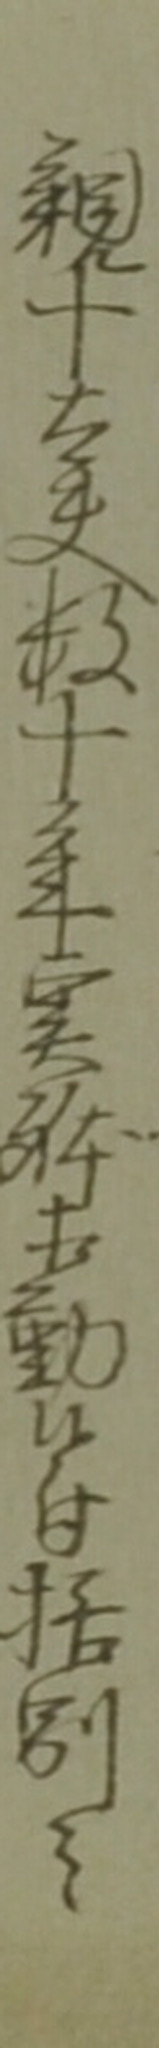親十太夫数十年実体相勤候付格別之
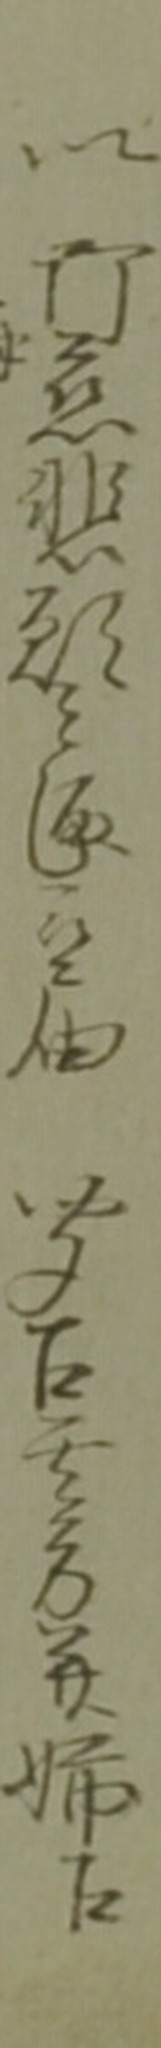以御慈悲願之趣被届聞召其方并姉江
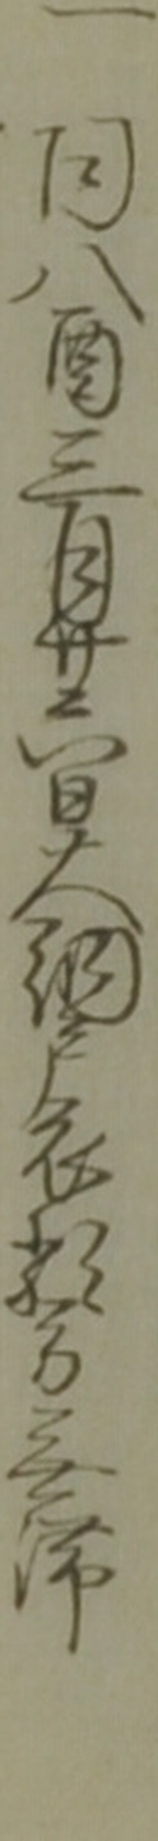一同八酉三月廿六日大納戸衣類方無滞
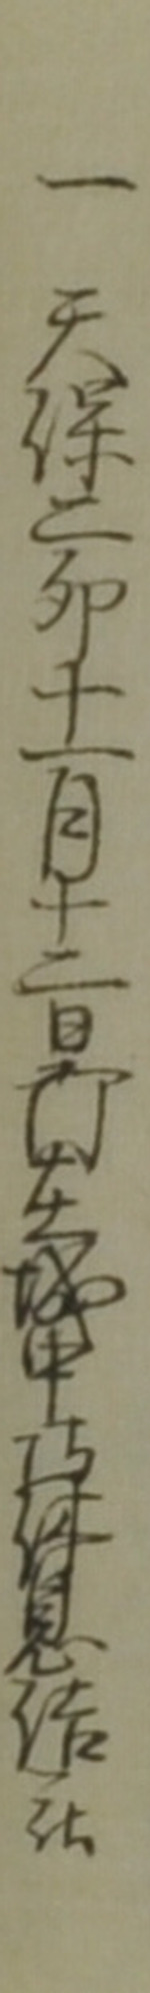一天保二卯十一月十二日御在城中御休息詰被
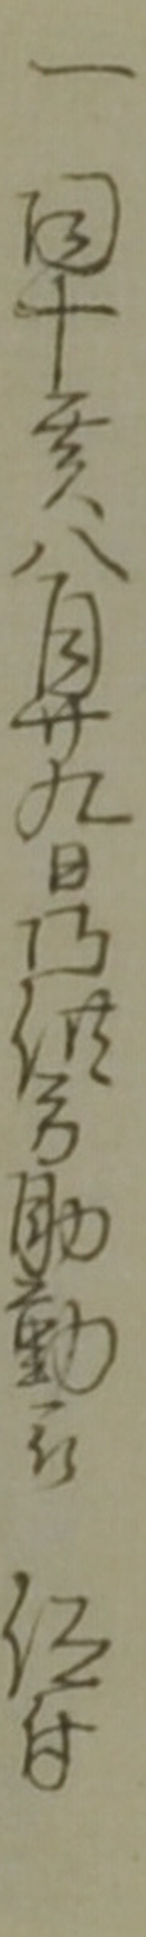一同十亥八月廿九日御供方助勤被仰付
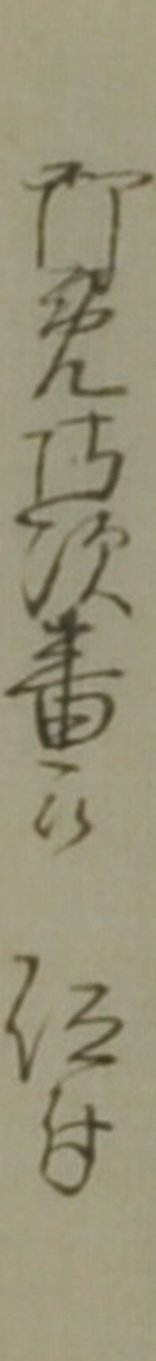御免御次番被仰付
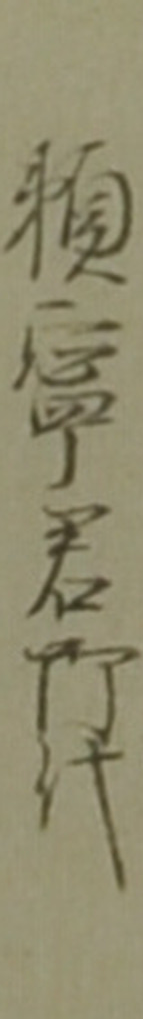頼寧君御代
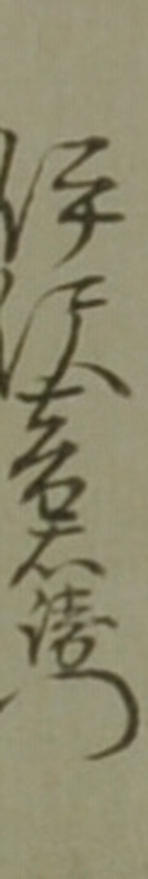伊沢音右衛門
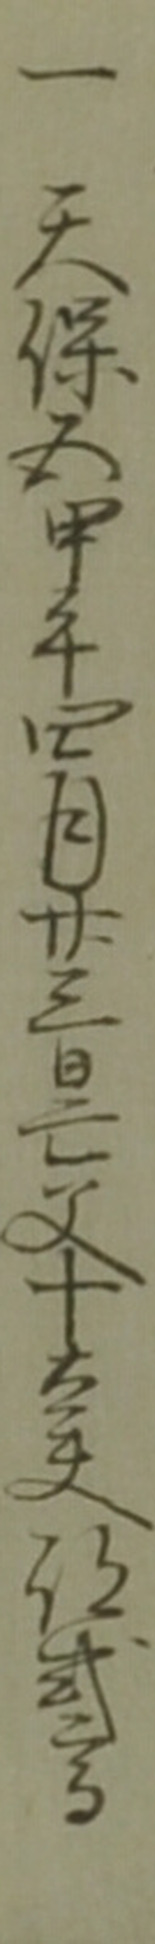一天保五甲午四月廿三日亡父十太夫跡式高
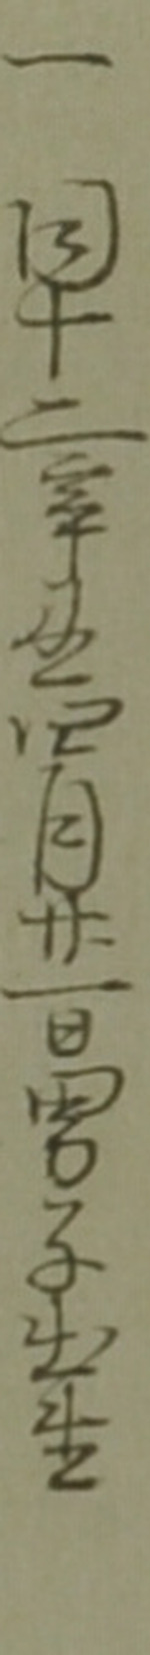一同十二辛丑四月廿一日男子出生
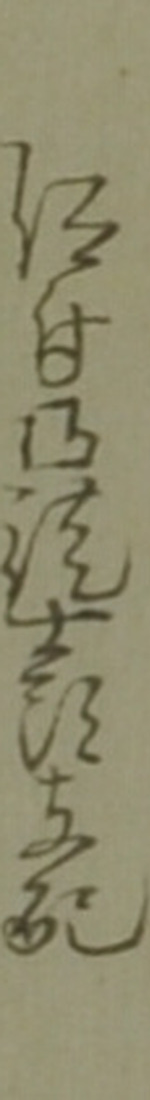仰付御徒士頭支配
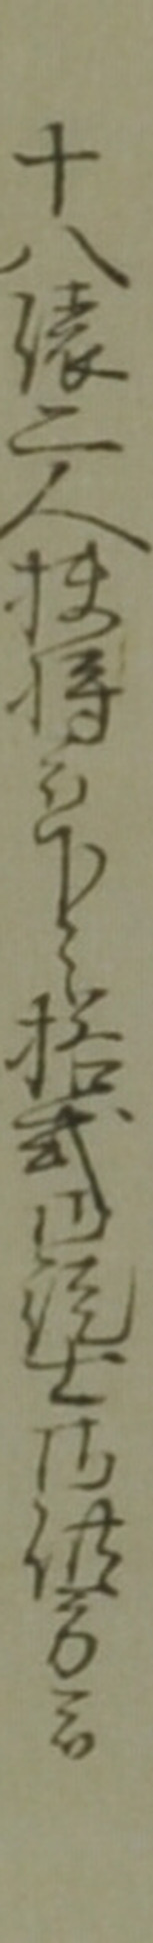十八俵二人扶持被下之格式御徒士御供方被
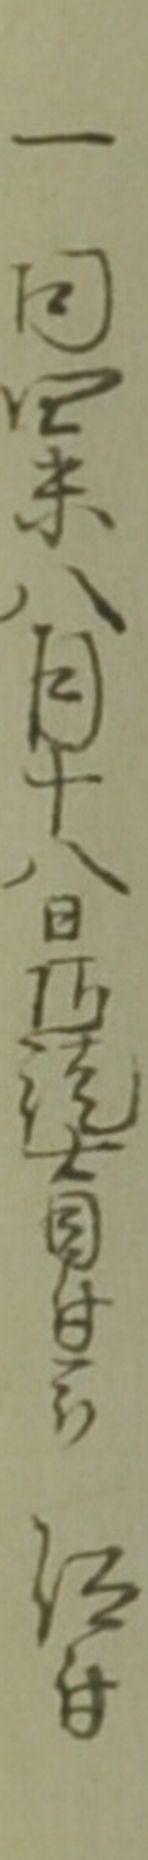一同四未八月十八日御徒士目付被仰付
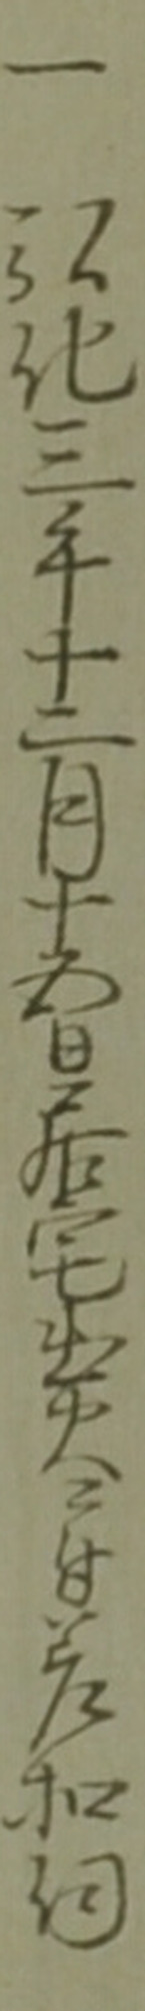一弘化三午十二月十五日居宅出火ニ付差控伺
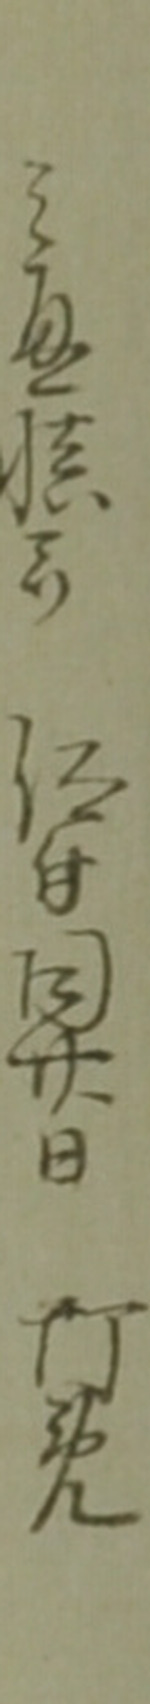之通慎被仰付同廿日御免

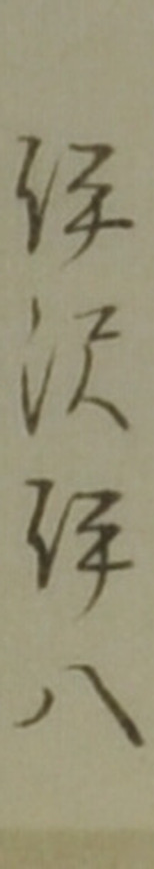伊沢伊八
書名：無足諸士勤仕録（三）
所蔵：伊那市立高遠町図書館・合同会社AMANE
